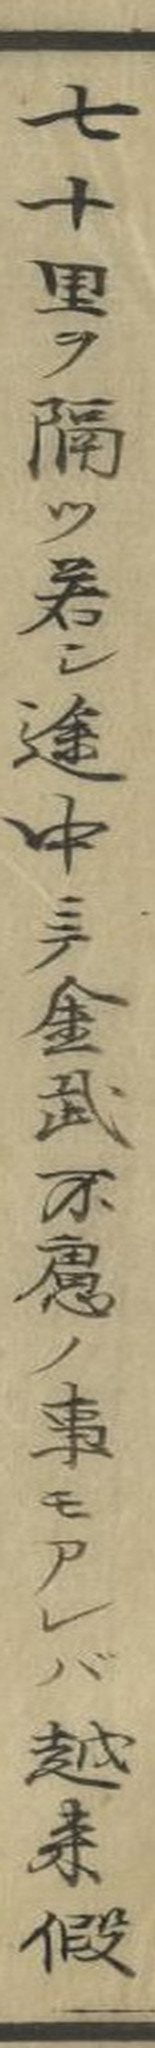七十里ヲ隔ツ若シ途中ニテ金武不慮ノ事モアレバ越来仮
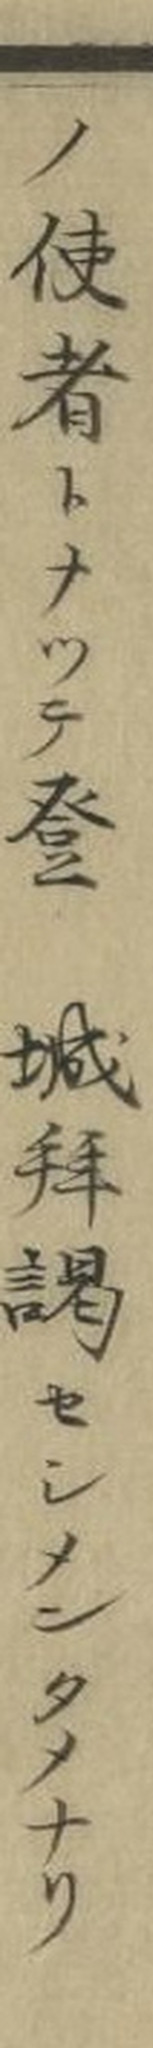ノ使者トナツテ登城拝謁セシメンタメナリ
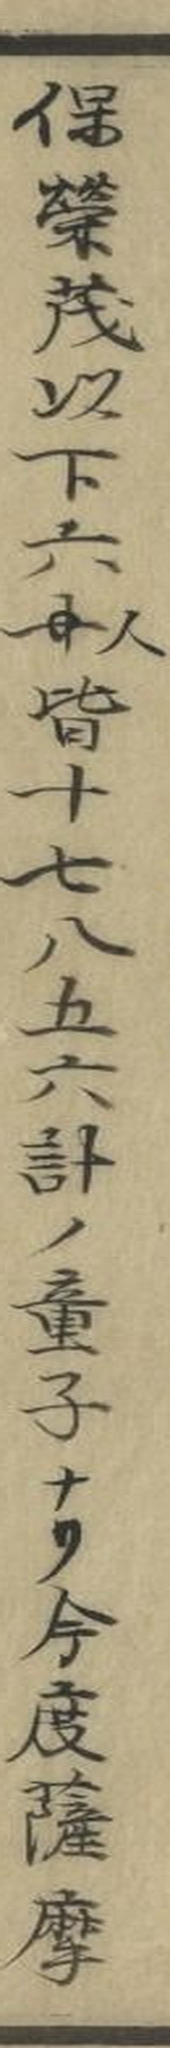保栄茂以下六人皆十七八五六計ノ童子ナリ今度薩摩
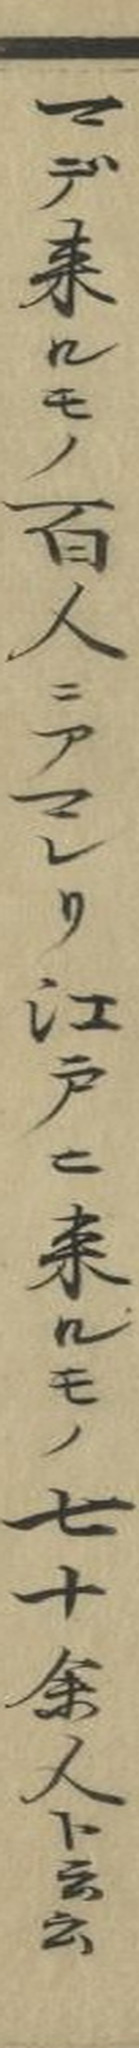マデ来ルモノ百人ニアマレリ江戸ニ来ルモノ七十余人ト云々
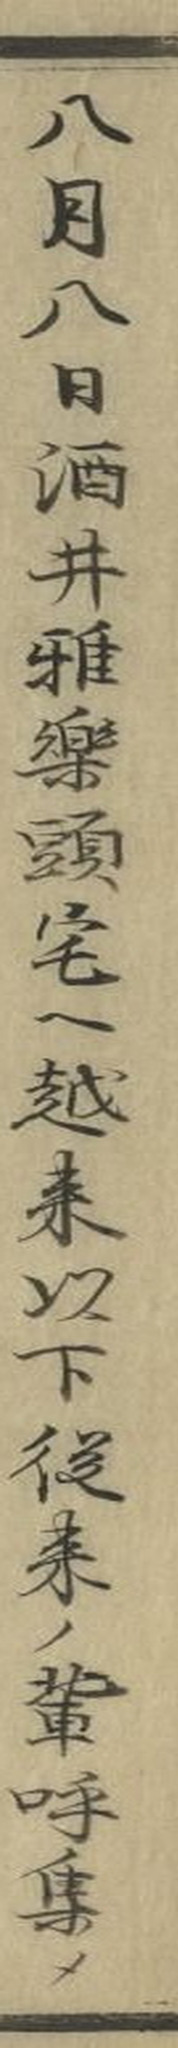八月八日酒井雅楽頭宅へ越来以下従来ノ輩呼集メ
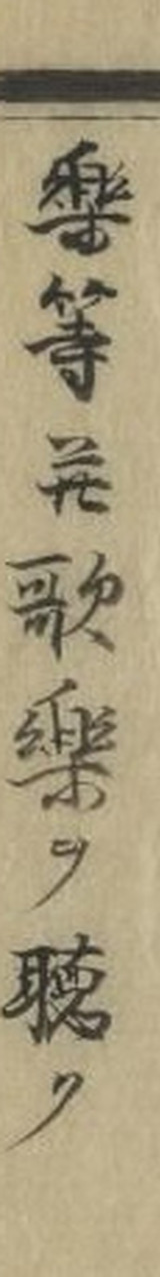楽等幷歌楽ヲ聴ク
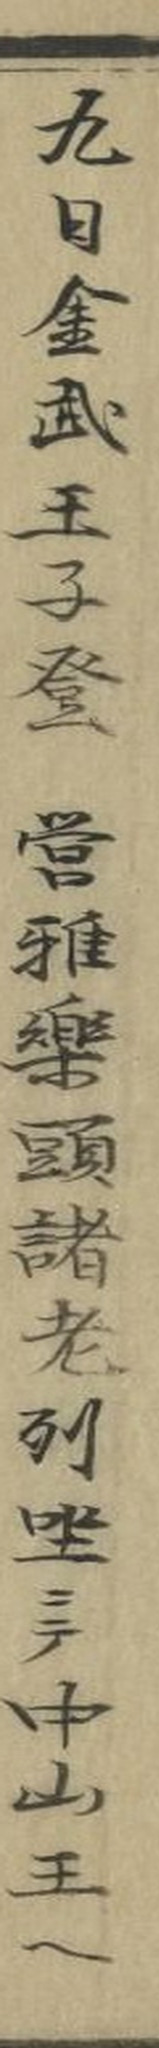九日金武王子登城雅楽頭諸老列坐ニテ中山王へ
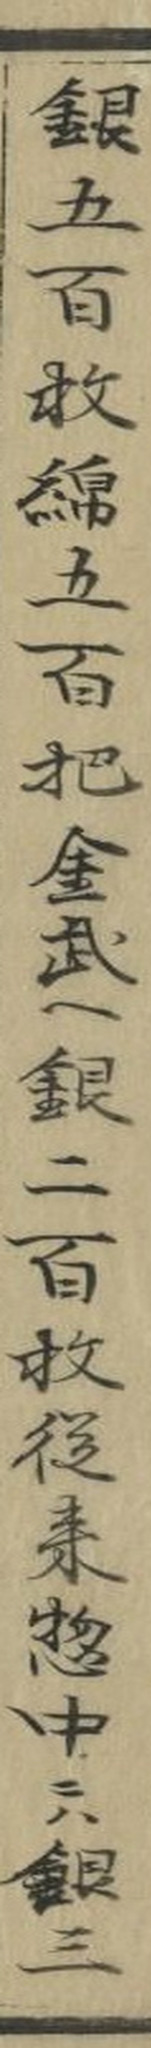銀五百枚綿五百把金武へ銀二百枚従来惣中ニハ銀三
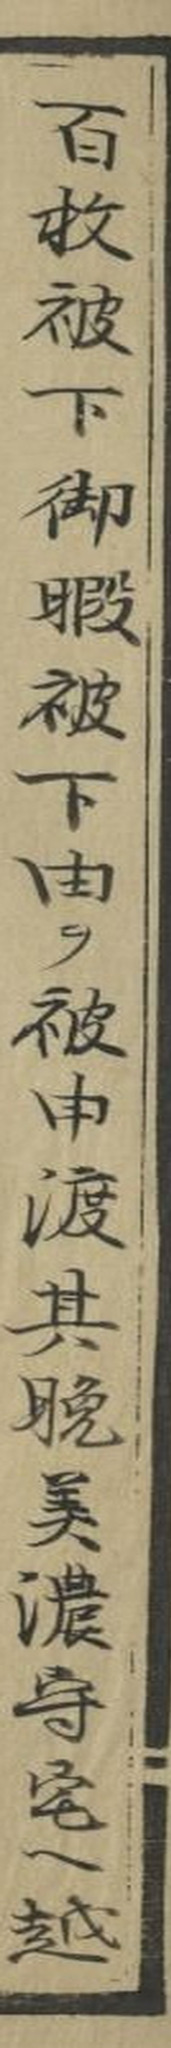百枚被下御暇被下由ヲ被申渡其晩美濃守宅へ越
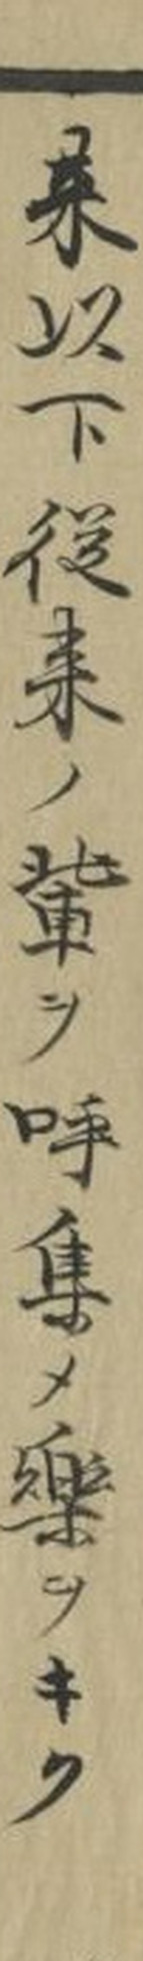来以下従来ノ輩ヲ呼集メ楽ヲキク
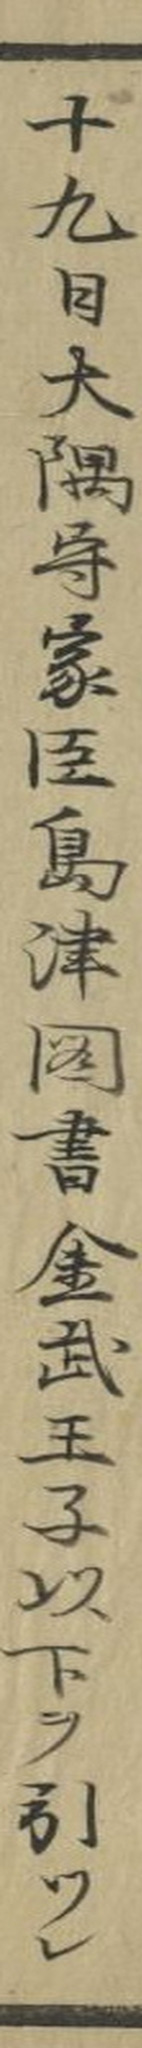十九日大隅守家臣島津図書金武王子以下ヲ引ツレ
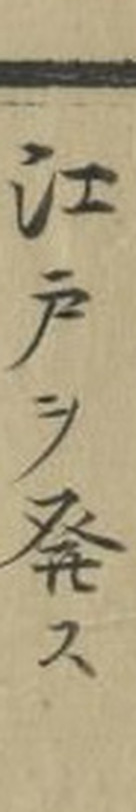江戸ヲ発ス
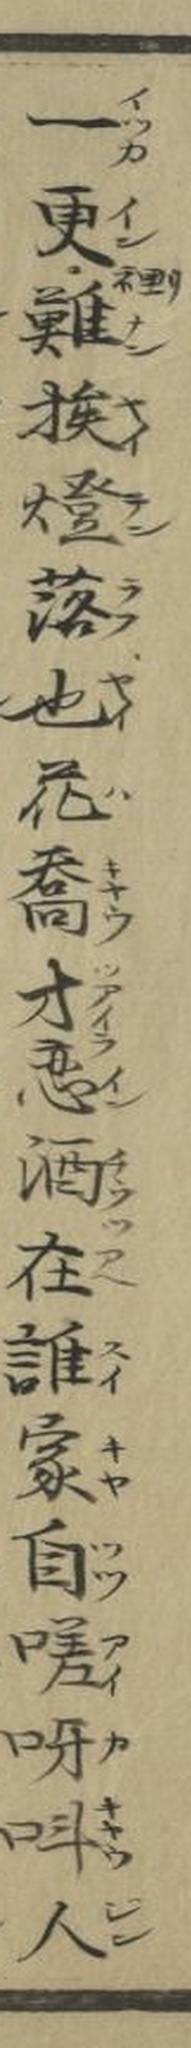一更裡難挨燈落也花喬才恋酒在推家自嗟呀叫人
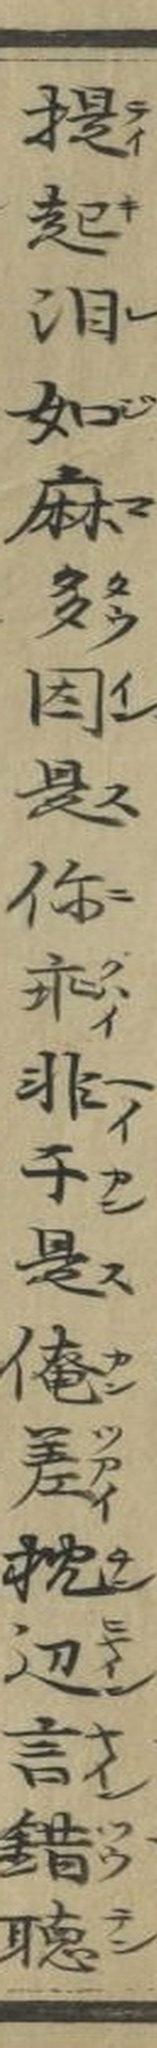提起泪如麻多因是你乖非于是俺差枕辺言錯聴
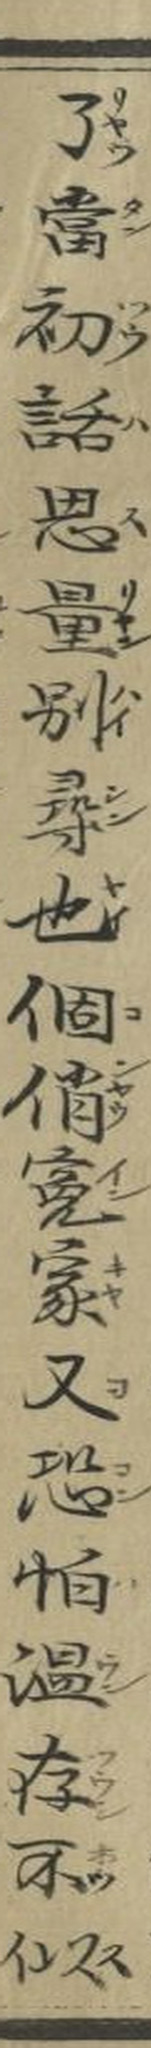了当初話思量別尋也個悄冤家又恐怕温存不似
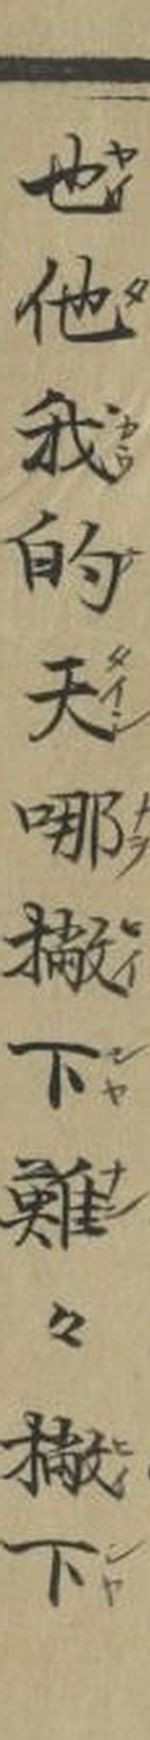也他我的天哪撇下難々撇下
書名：琉球往来（下）
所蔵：University of the Ryukyus Library
